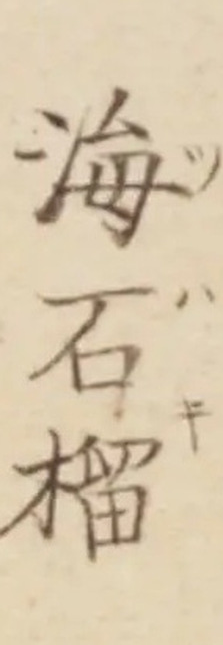海石榴
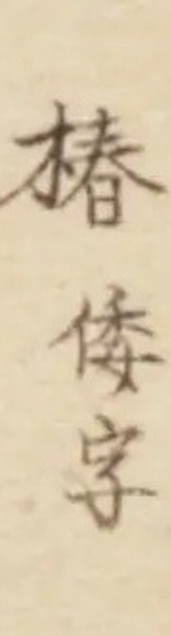椿倭字
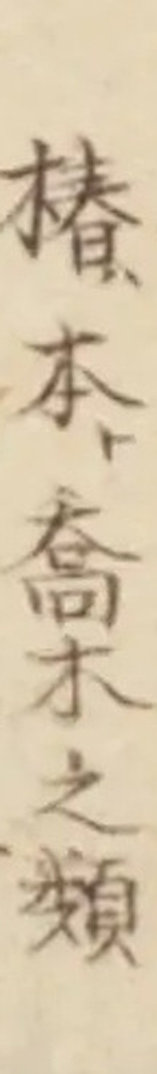椿本喬木之類
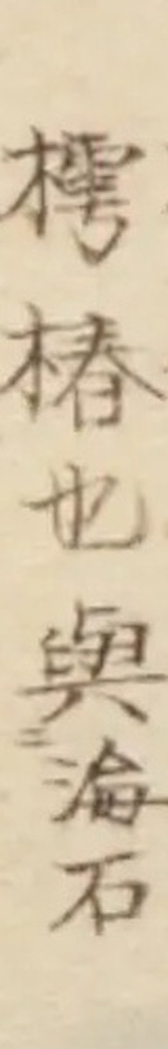樗椿也与海石
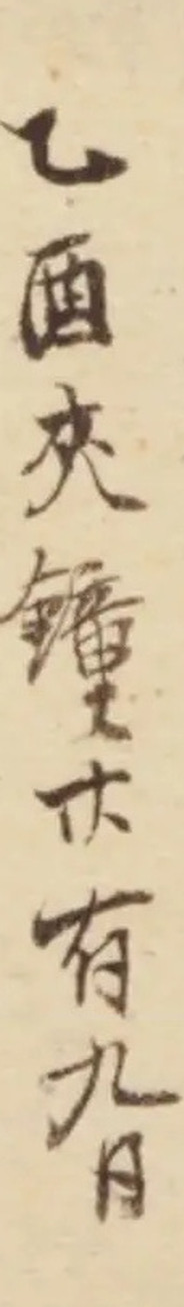乙酉夾鐘廿有九日
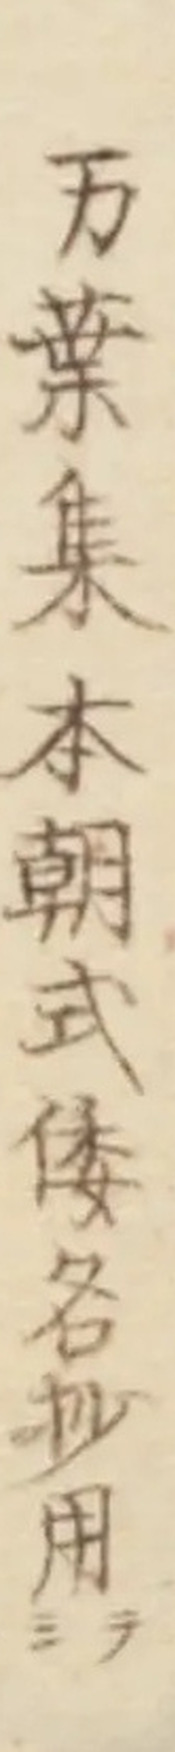万葉集本朝式倭名抄用テ
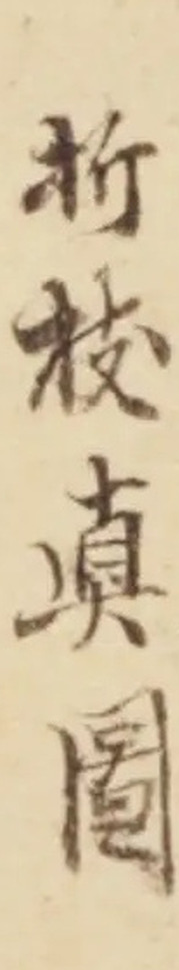折枝真図
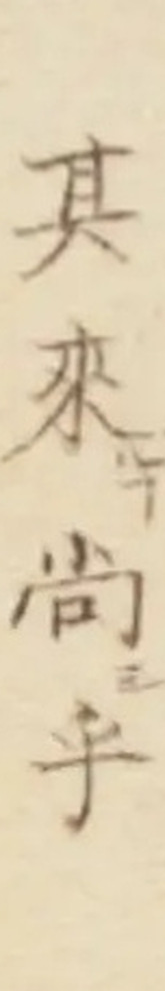其來ルヲ尚シ乎
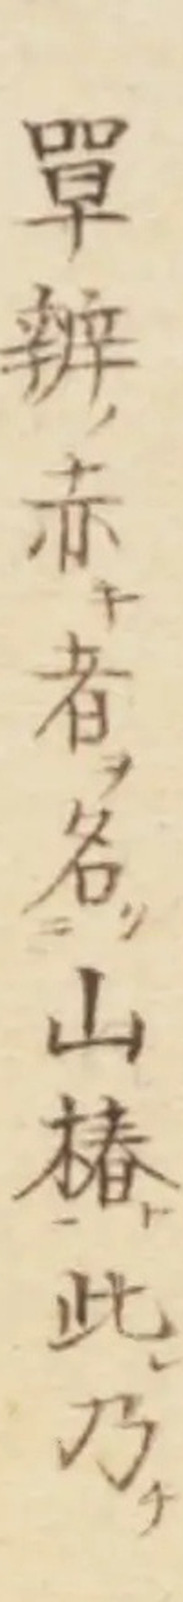單辨ノ赤ト者ヲ名ク山椿ト此レ乃チ
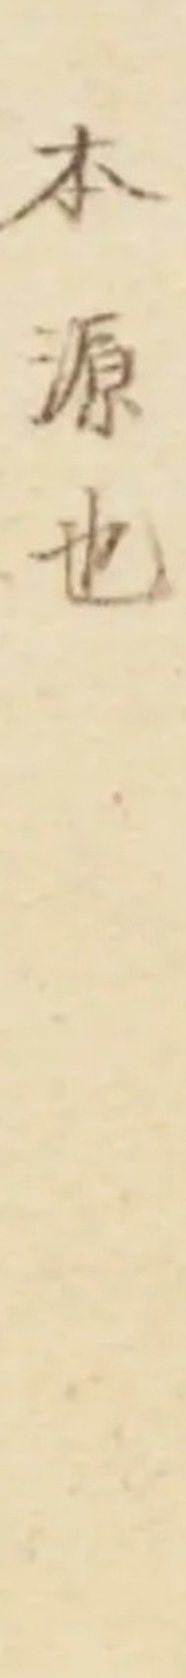本源也

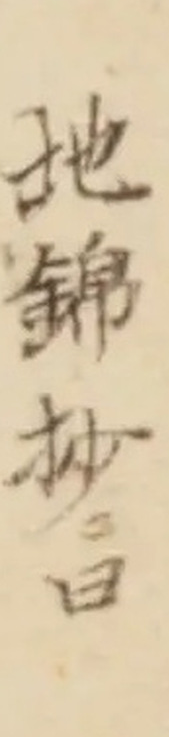地錦抄ニ曰
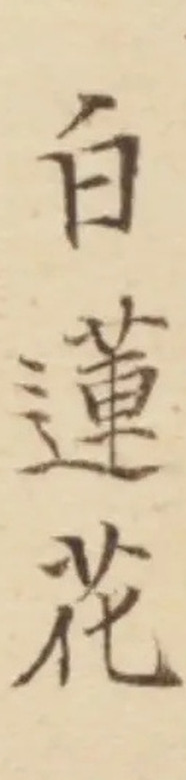白蓮花
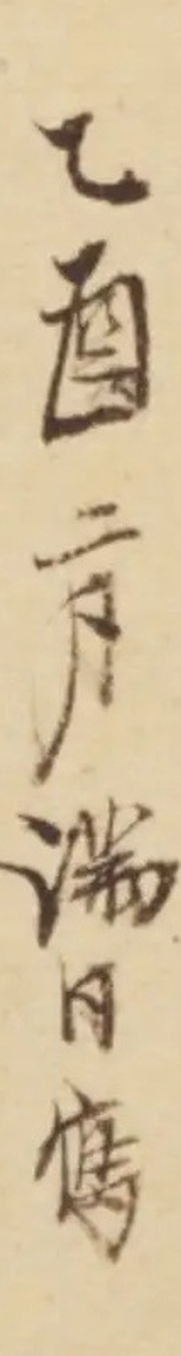乙酉二月満月寫
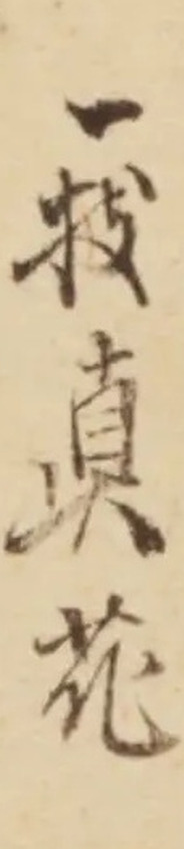一枝真花

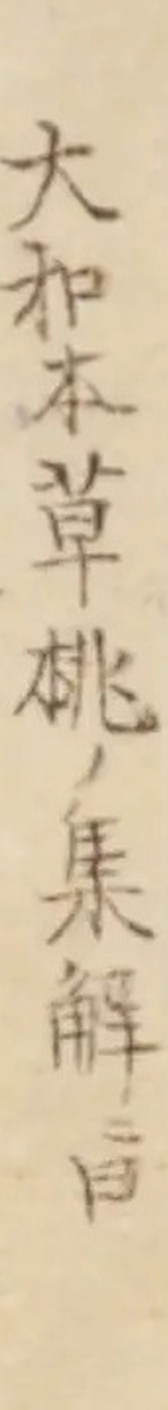大和本草桃ノ集解ニ曰
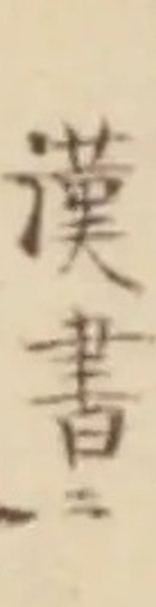漢書ニ
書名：梅園草木花譜春之部. 2
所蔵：国立国会図書館 National Diet Library, JAPAN
